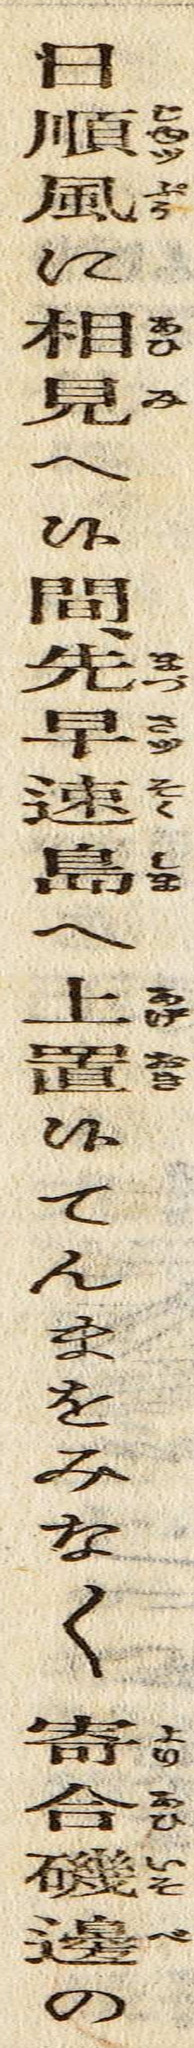日順風に相見へ候間、先早速島へ上置候てんまをみな〳〵寄合磯辺の
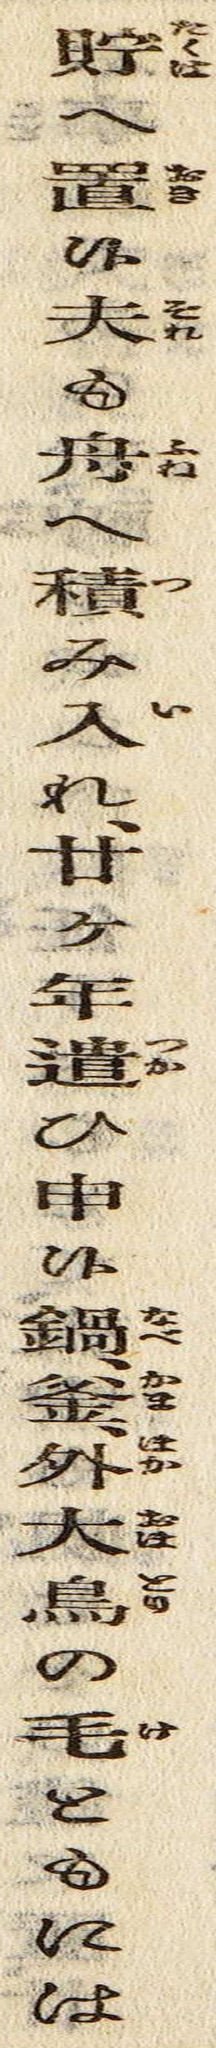貯へ置候夫も舟へ積み入れ、廿ケ年遣ひ申候鍋、釜、外大鳥の毛ともには
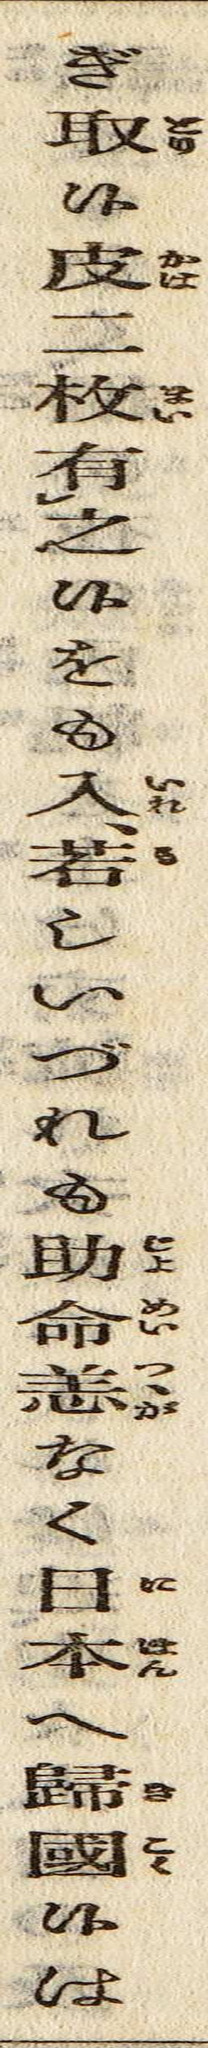ぎ取候皮二枚有之候をも入、若しいづれも助命恙なく日本へ帰国候は
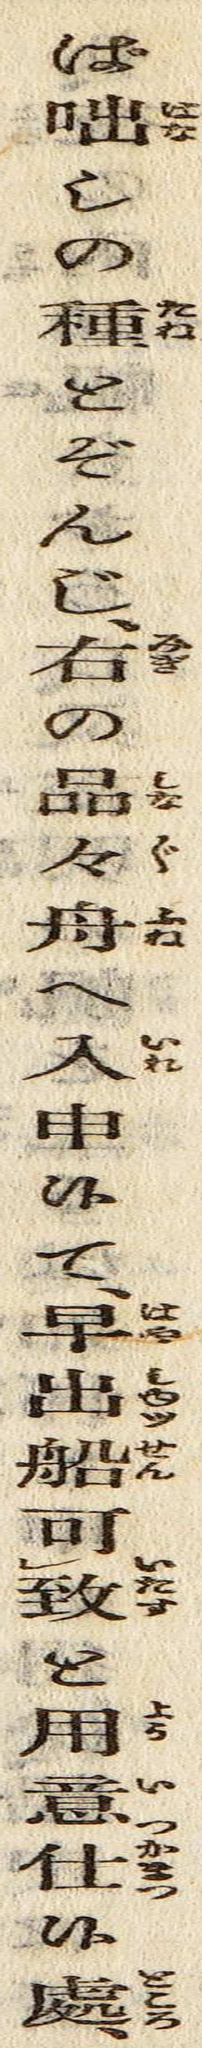ば咄しの種とぞんじ、右の品々舟へ入申候て、早出船可致と用意仕候処、
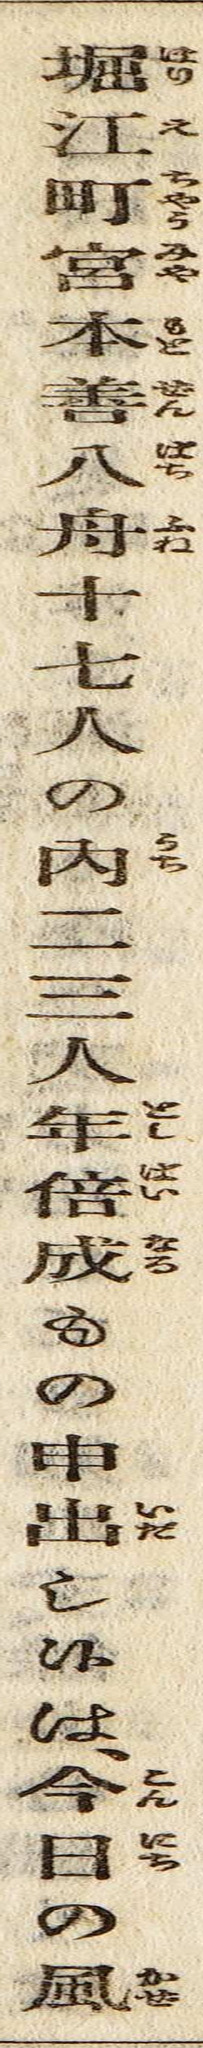堀江町宮本善八舟十七人の内二三人年倍成もの申出し候は、今日の風
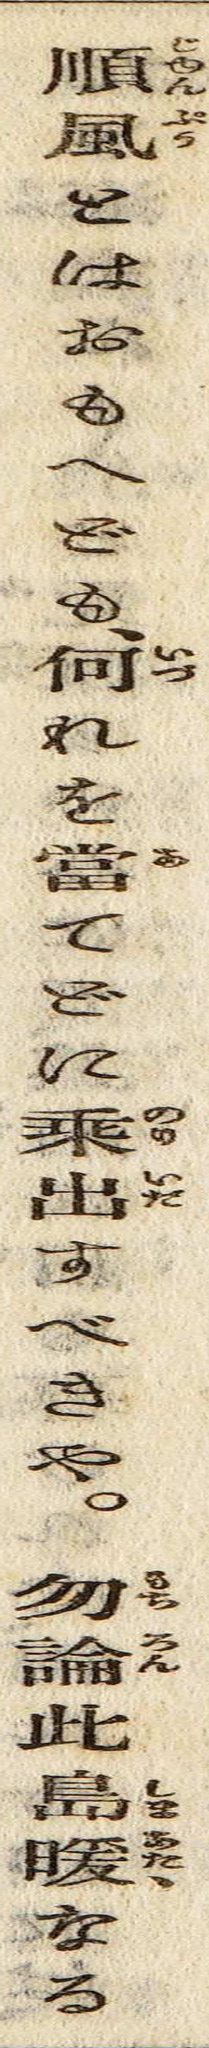順風とはおもへども、何れを当てどに乗出すべきや。勿論此島暖なる
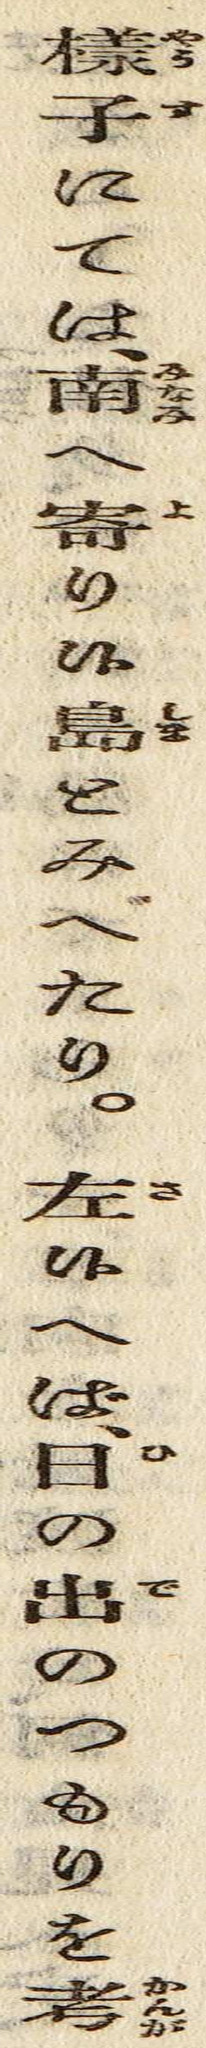様子にては、南へ寄り候島とみへたり。左候へば、日の出のつもりを考
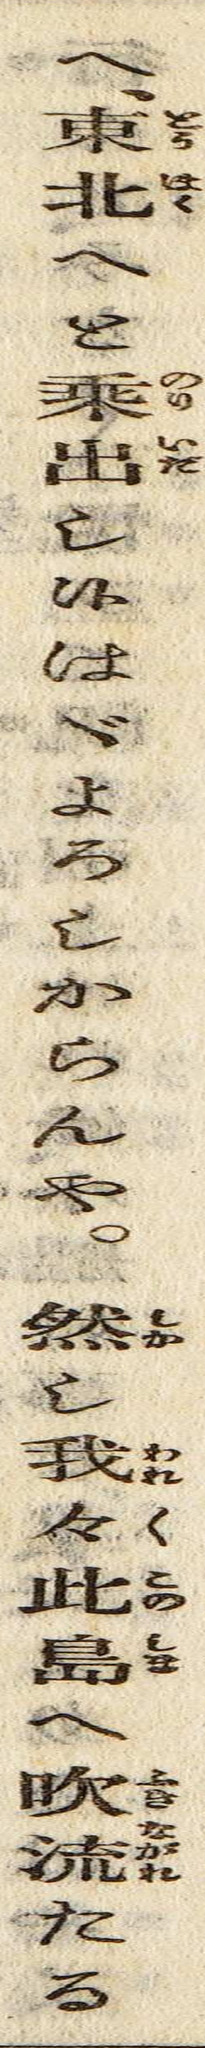へ、東北へと乗出し候はヾよろしからんや。然し我々此島へ吹流たる
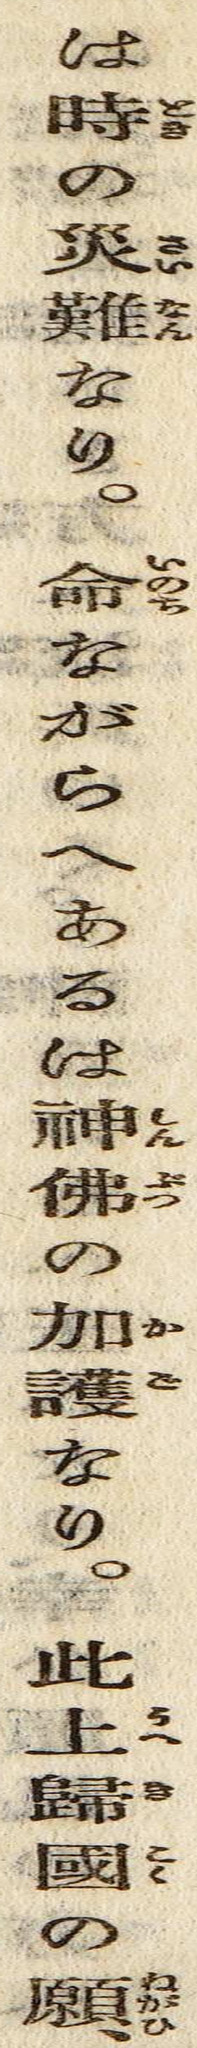は時の災難なり。命ながらへあるは神仏の加護なり。此上帰国の願、
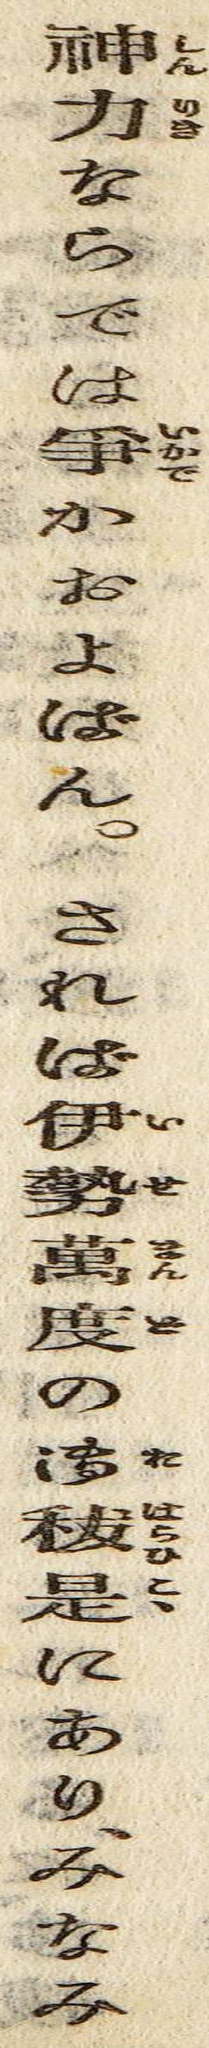神力ならでは争かおよばん。されば伊勢万度の御祓是にあり、みなみ
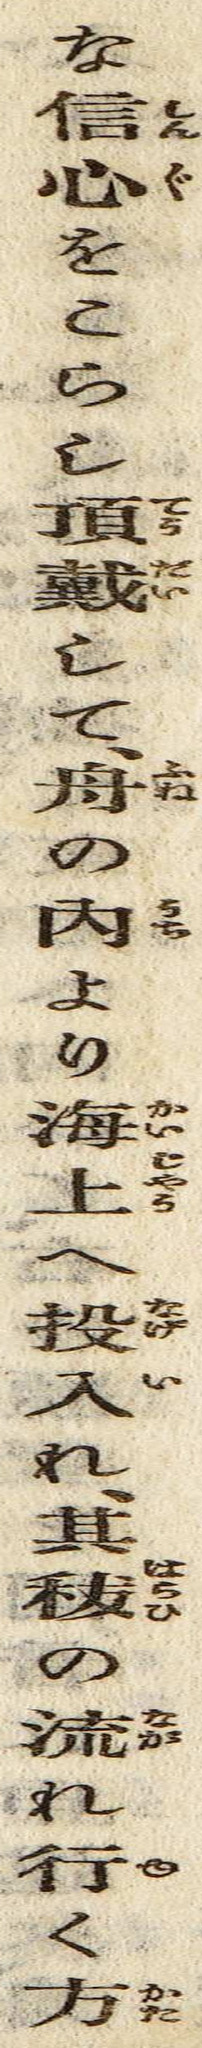な信心をこらし頂戴して、舟の内より海上へ投入れ、其祓の流れ行く方

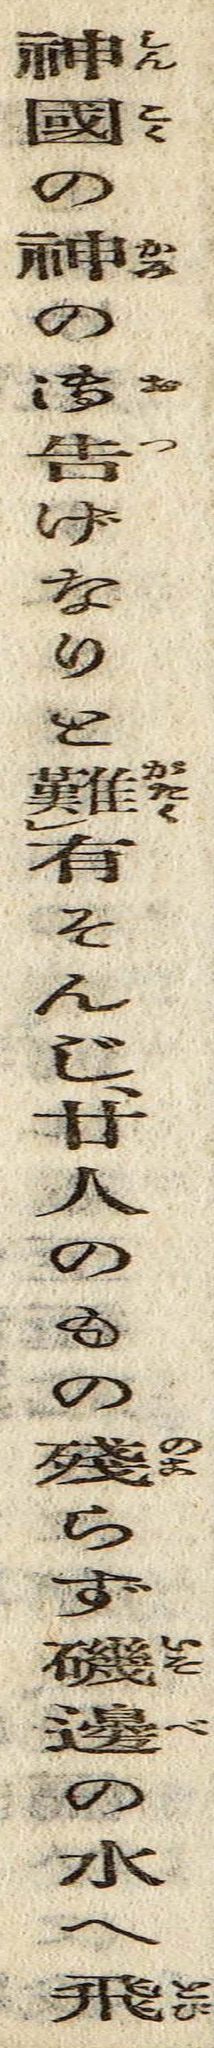神国の神の御告げなりと難有そんじ、廿人のもの残らず磯辺の水へ飛
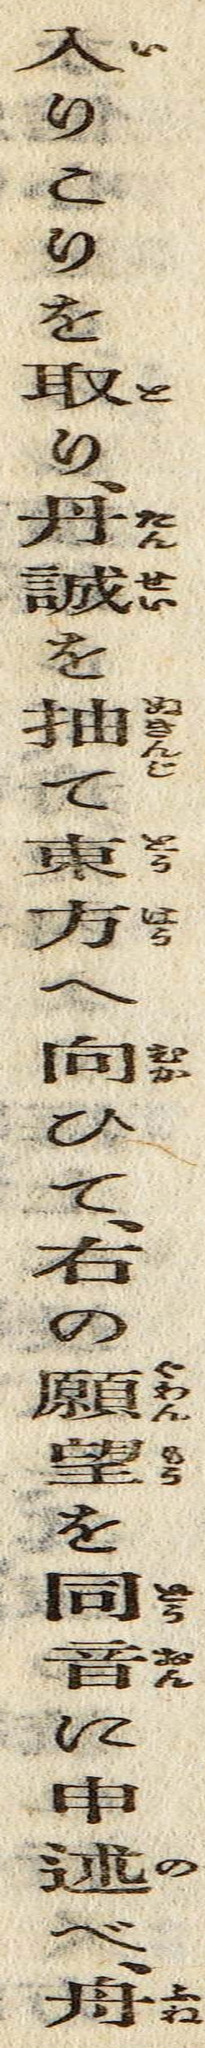入りこりを取り、丹誠を抽て東方へ向ひて、右の願望を同音に申述べ、舟
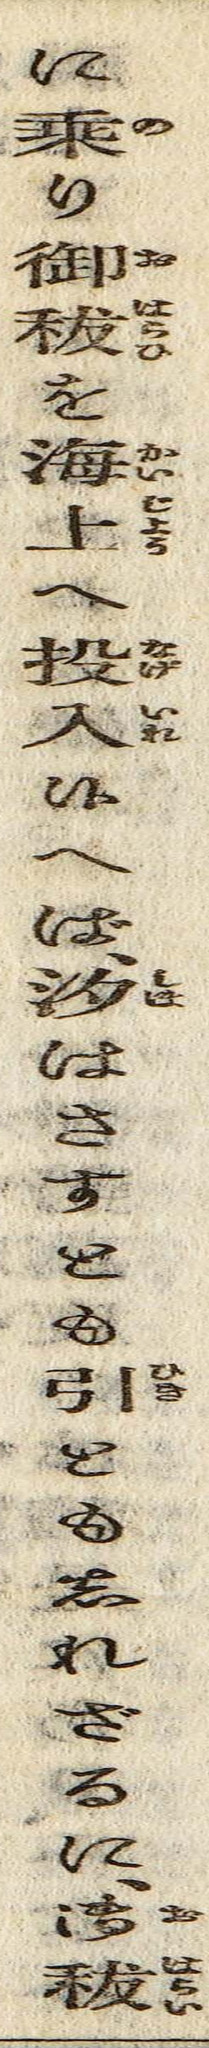に乗り御祓を海上へ投入候へば、汐はさすとも引ともしれざるに、御祓
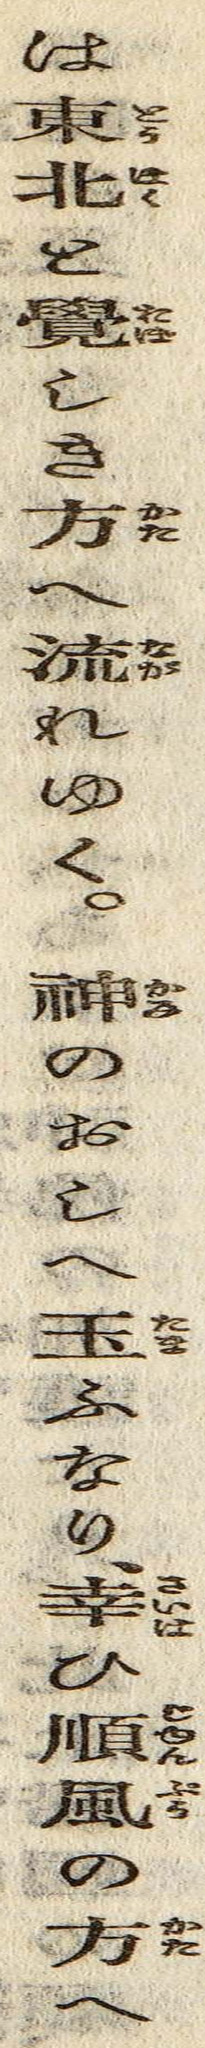は東北と覚しき方へ流れゆく。神のおしへ玉ふなり、幸ひ順風の方へ
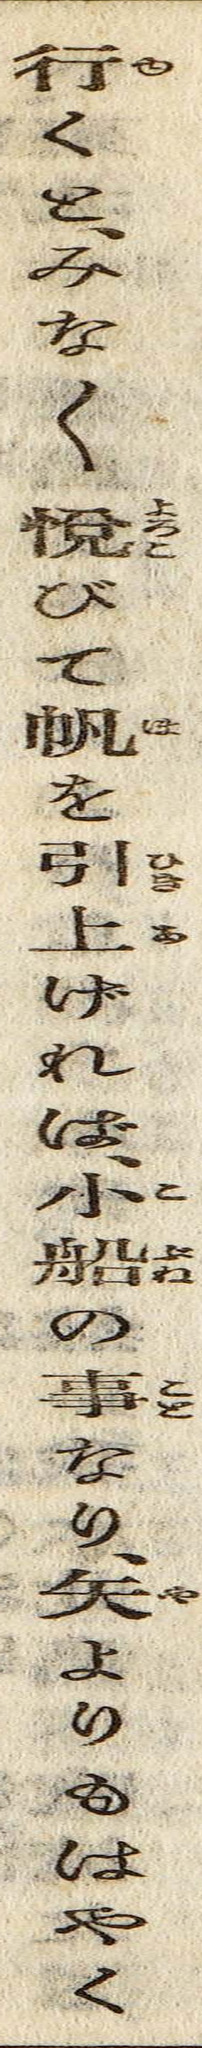行くと、みな〳〵悦びて帆を引上げれば、小船の事なり、矢よりもはやく
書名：日本漂流譚
